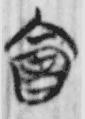會
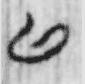㠯（以）
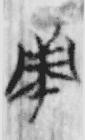央
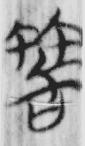蓍
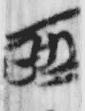爲
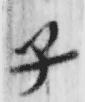子
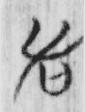左
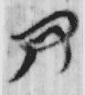尹
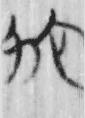{力它}
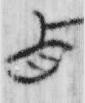貞
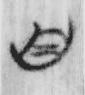自
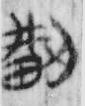○（荆）
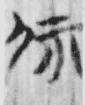𫵖
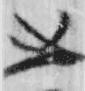之
